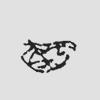智
